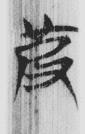皮
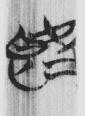既
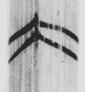大
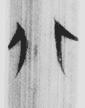北
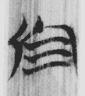於
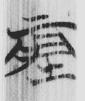坪
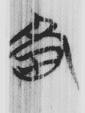{夊田}
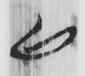㠯（以）
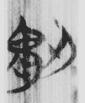{胃刀}
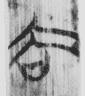去
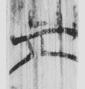亓
